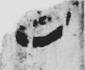旦
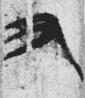又（有）
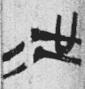吳（虞）
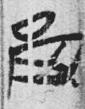是（氏）
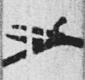之
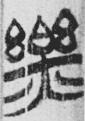樂
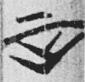正
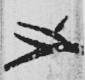之
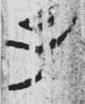子
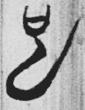也
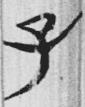子
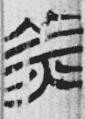羔
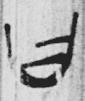曰
